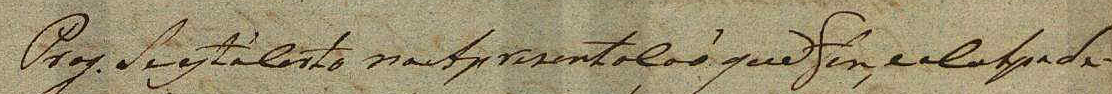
Prog. se está Certo na AprezentaÇaõ que fez, e a Culpa de
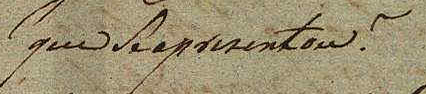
que se aprezentou?
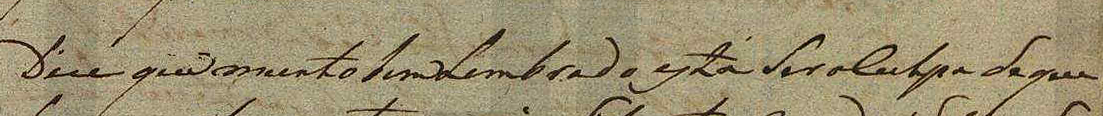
Dice que munto bem Lembrado está ser a Culpa de que
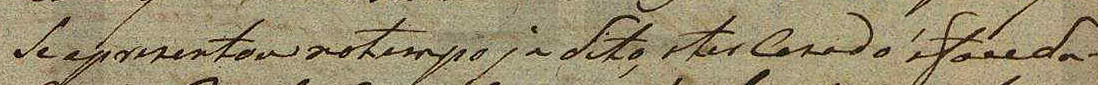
se aprezentou no tempo ja dito, e ter Cazado ē face da
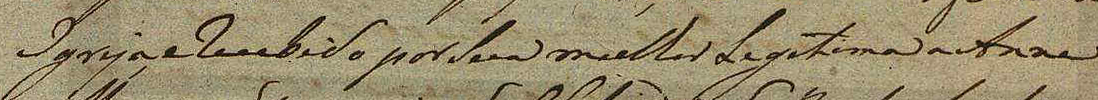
Igreja, e Recebido por Sua mulher Legitima a Anna
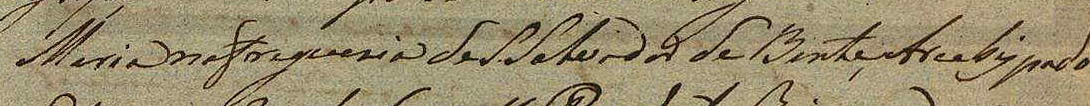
Maria na freguezia de S. Salvador de Bante, Arcebispado
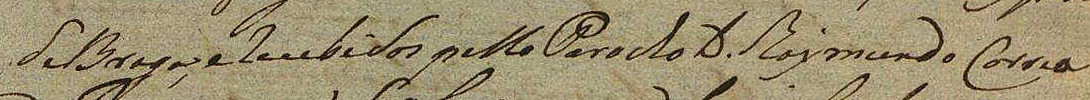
de Braga, e Recebidos pello Parocho D. Raymundo Correa
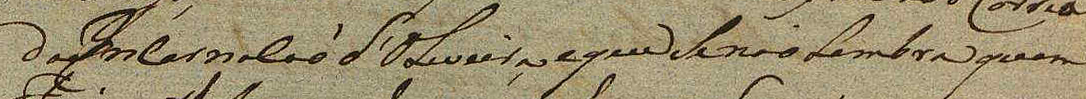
da JnCarnaÇaõ d'OLiveira, e que se naõ Lembra quem
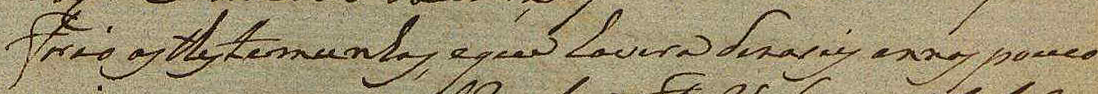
foraõ as thestemunhas, e que havera dezaseis annos pouco
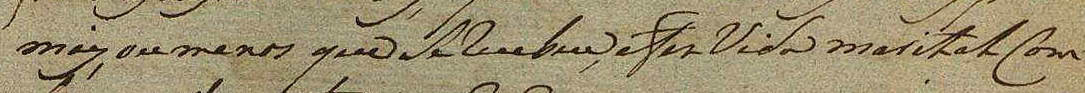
mais, ou menos que se Recebeu, e fez Vida marital Com
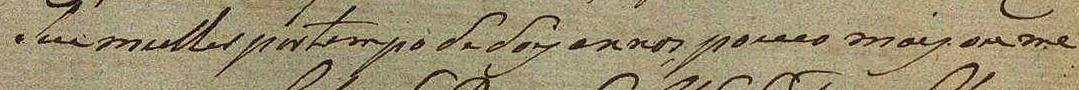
sua mulher por tempo de dois annos, pouco mais ou me
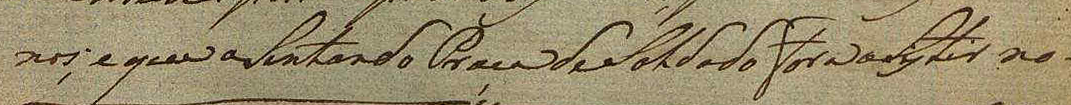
nos; e que aSentando Praça de Soldado fora asistir no
